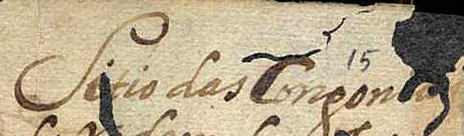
Sitio das Congon_as
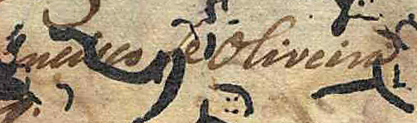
ncisco de oliveira
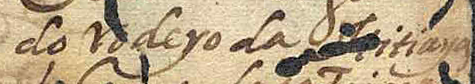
do rodeyo da Ititiaya
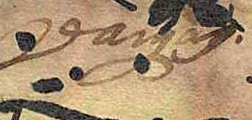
Vargas.
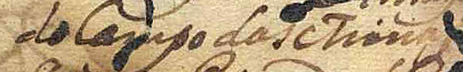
do Campo das Minas
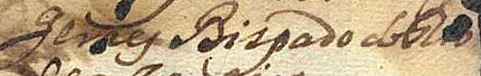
Geraes Bispado do Rio
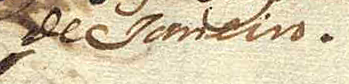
de Ianeiro.
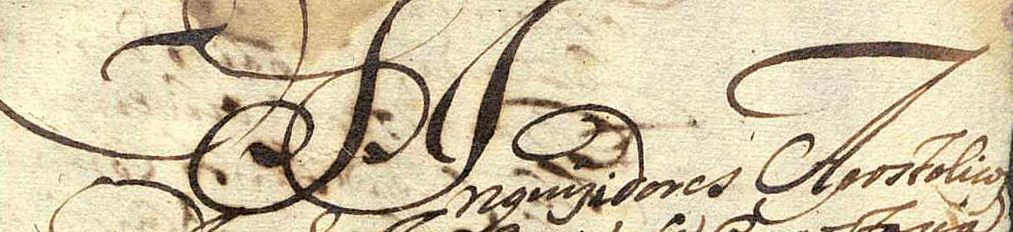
OS Inquisidores Apostolicos
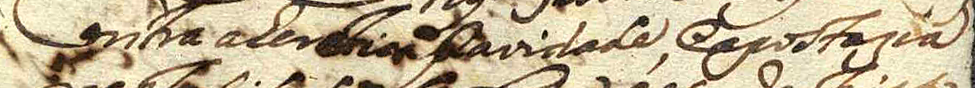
Contra a heretica pravidade, e apostazia
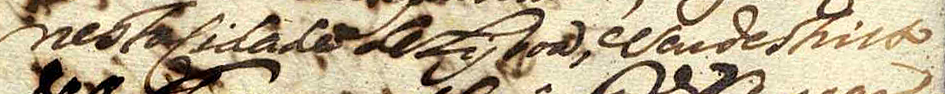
nesta Cidade de Lisboa, e seu destricto
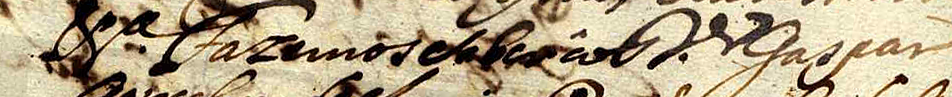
&a. Fazemos saber âo D.or Gaspar
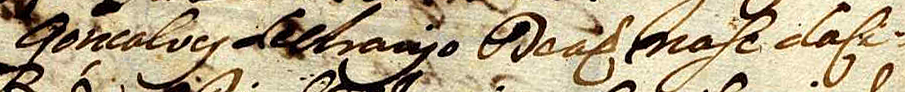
Gonçalves de Araujo Deaõ na se da Ci
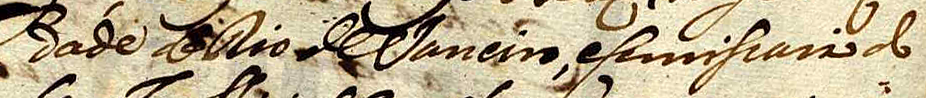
dade do Rio de Ianeiro, e Comissario do
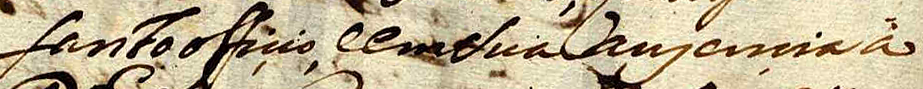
santo oficio, e em sua auzencia a
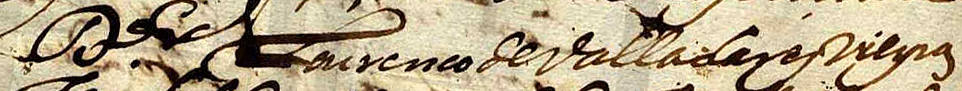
D.or Lourenço de Valladares Vieyra
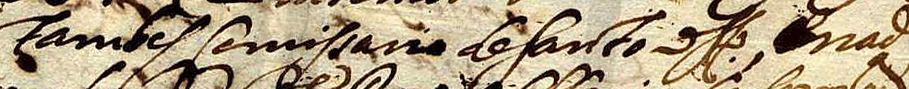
tambē Comissario do santo off.o, e na de
